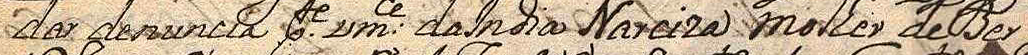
dar denunçia p.te v m:ce da India Narciza molher de Ber
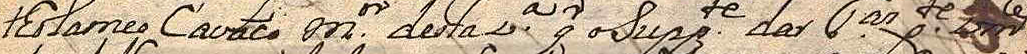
thoLameo Cavaco, m.or desta v.a qr o Supp.te dar T.as p.te v mce
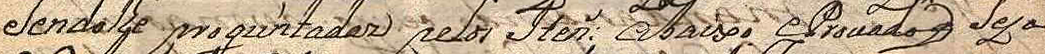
sendolhe proguntadaz pelos Itens: abaixo e Prouado q̄ seja
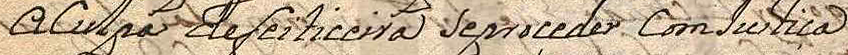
a culpa de feiticeira se proçeder com Iustiça
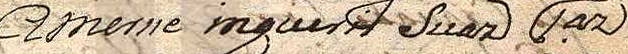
a mersse inquerir suaz T.az
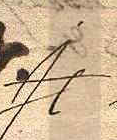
item
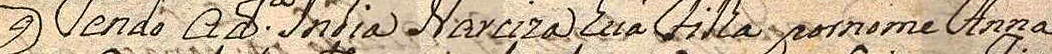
q̄ Tendo a dt.a India Narciza huā Filha por nome Anna
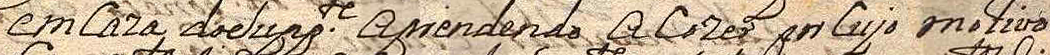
em caza do supp.te aprendendo a cozer por cujo motivo
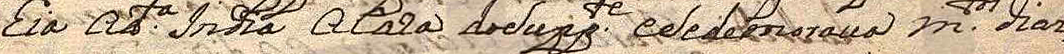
hia a dt.a India a caza do supp.te e se demorava m.tos diaz
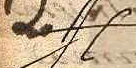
2 item
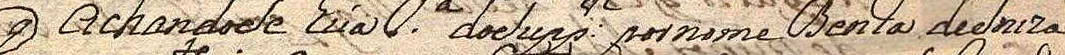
q̄ achandose hūa T.a do supp:te por nome Benta de souza
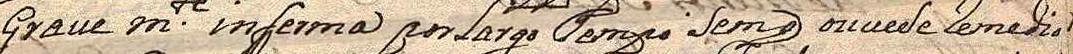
gravem.te inferma por Largo Tempo sem q̄ ouvese Remedio
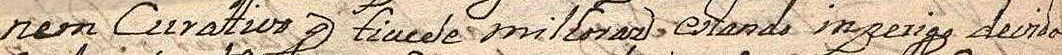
nem Curativo q̄ tivese milhoraz estando in perigo de vida
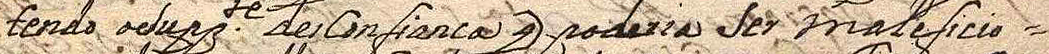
tendo o supp.te desconfiança q̄ poderia ser maleficio =
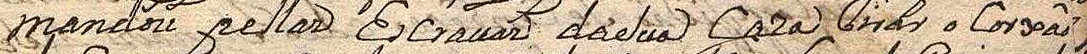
mandou pellaz Escravaz da sua Caza Tirar o Corxaõ
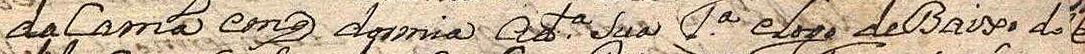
da Cama con q̄ dormia a dt.a sua F.a e Logo de Baixo do
